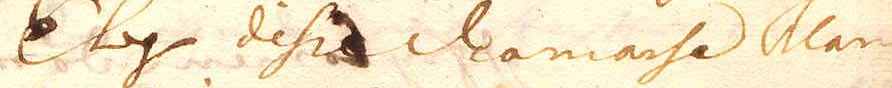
E logo disse chamarse Mar
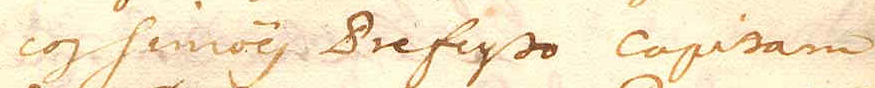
cos semoẽs Prefeyto capitam
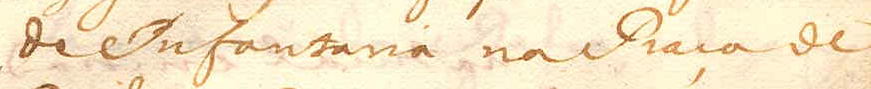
de Infantaria na Praça de
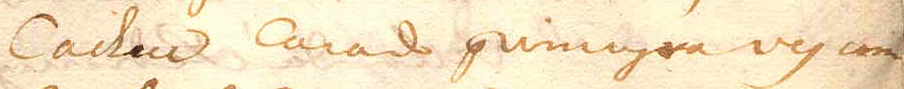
Cacheu Cazado pRimeyra ves com
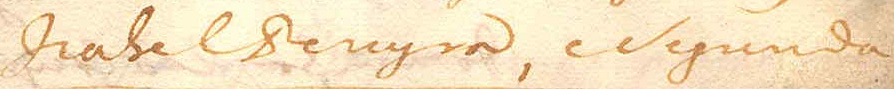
Jzabel Pereyra, e segunda
